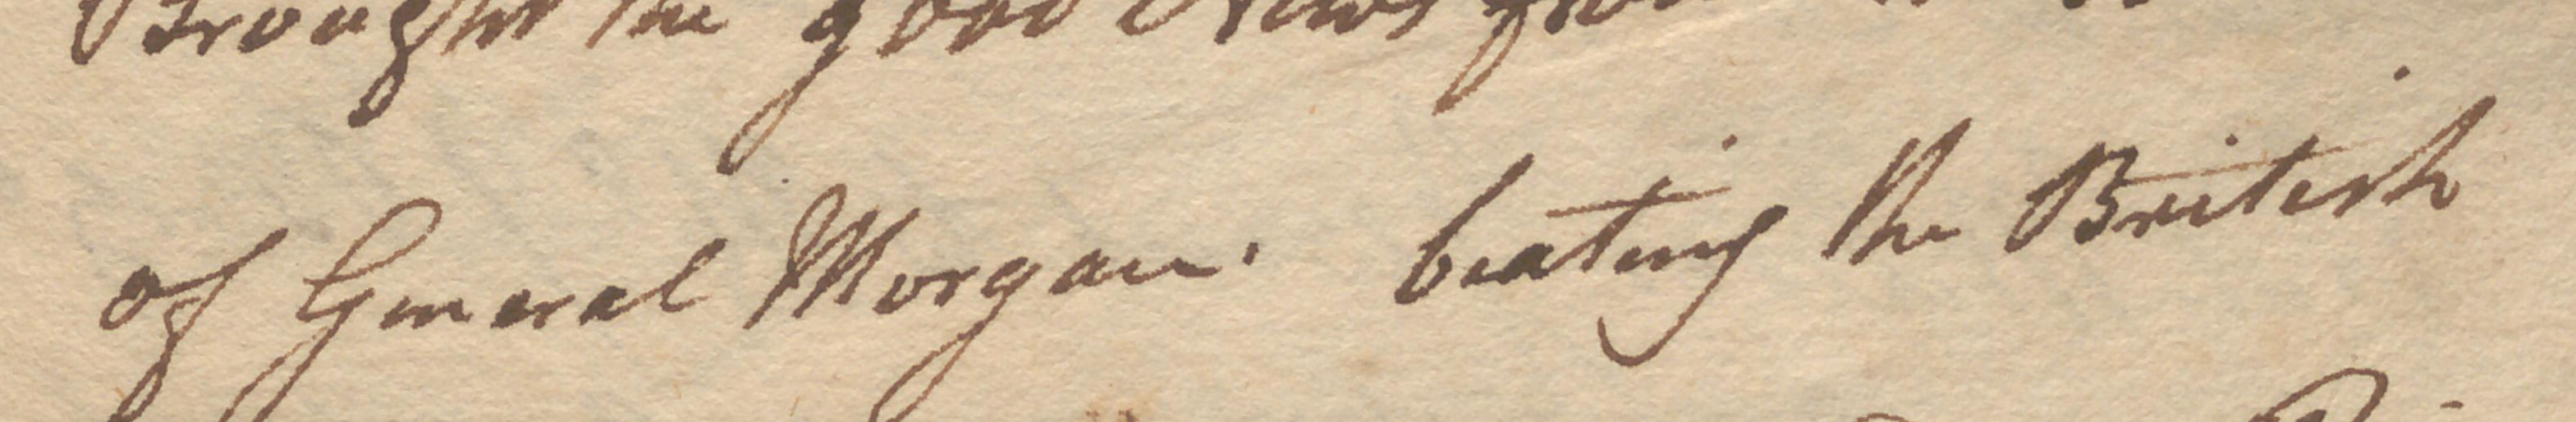of Generel Morgan beating the British
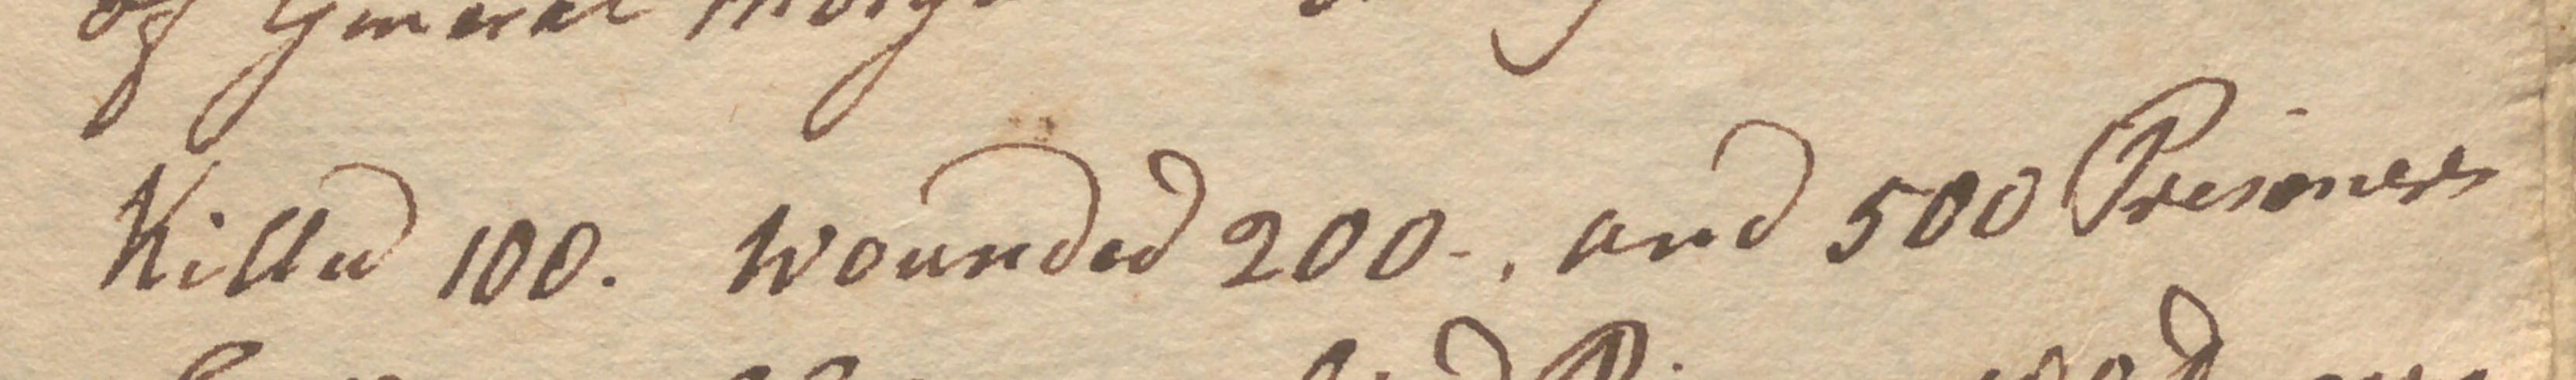Killed 100. Wounded 200. and 500 Prisoners
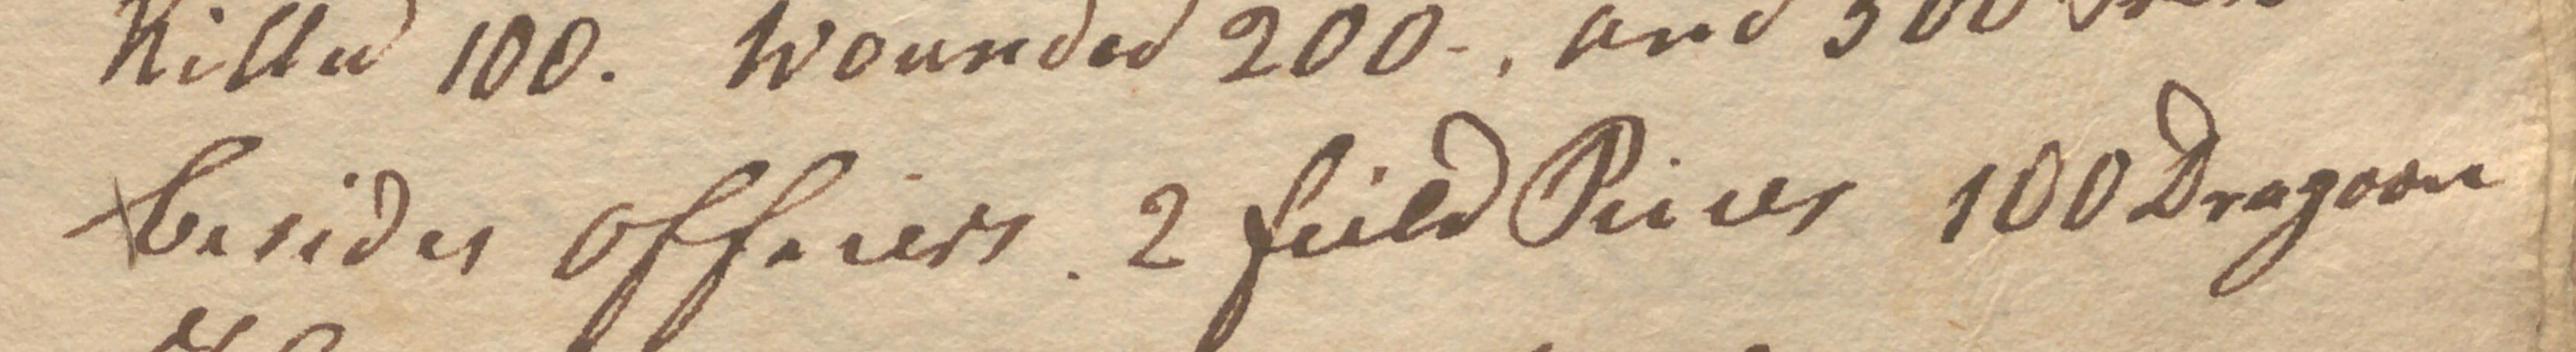besides officers. 2 field Prices 100 Dragoon
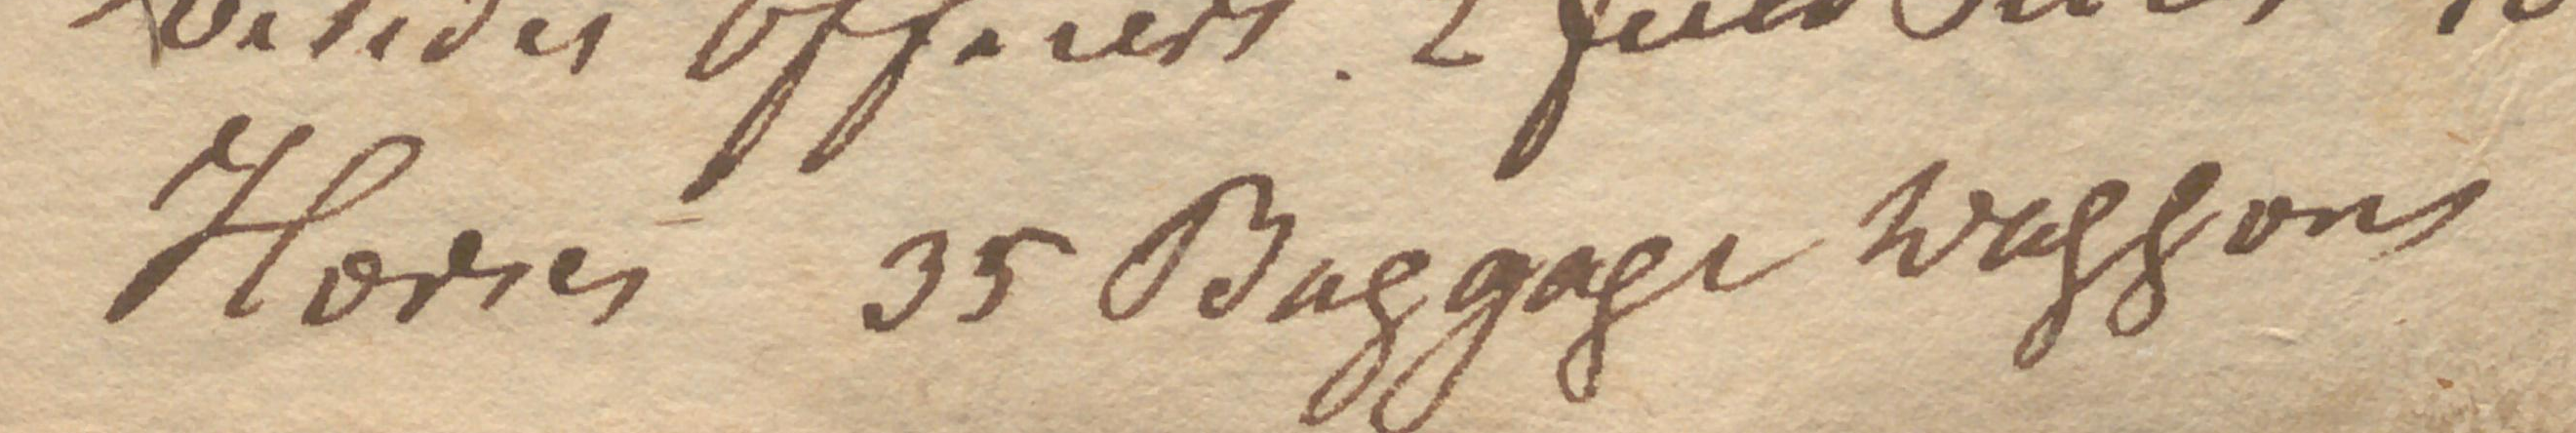Horses 35 Baggage waggons
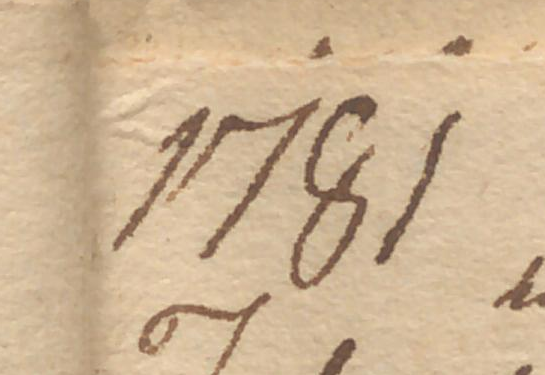1781
